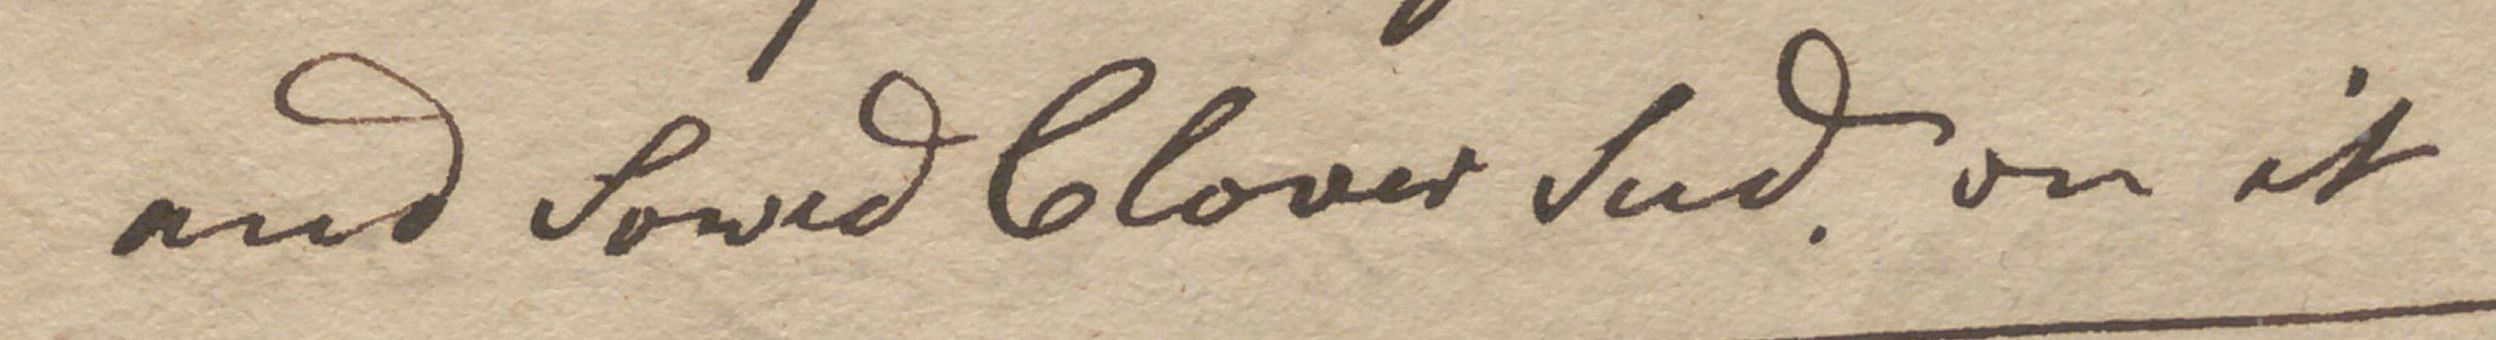and sowed Clover seed on it
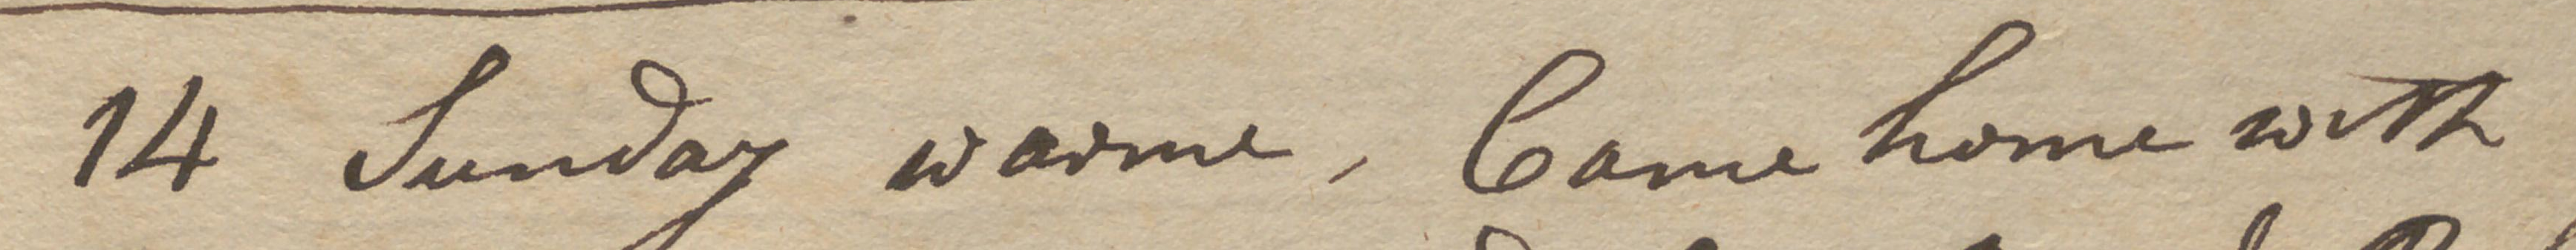14 Sunday warme, Came home with
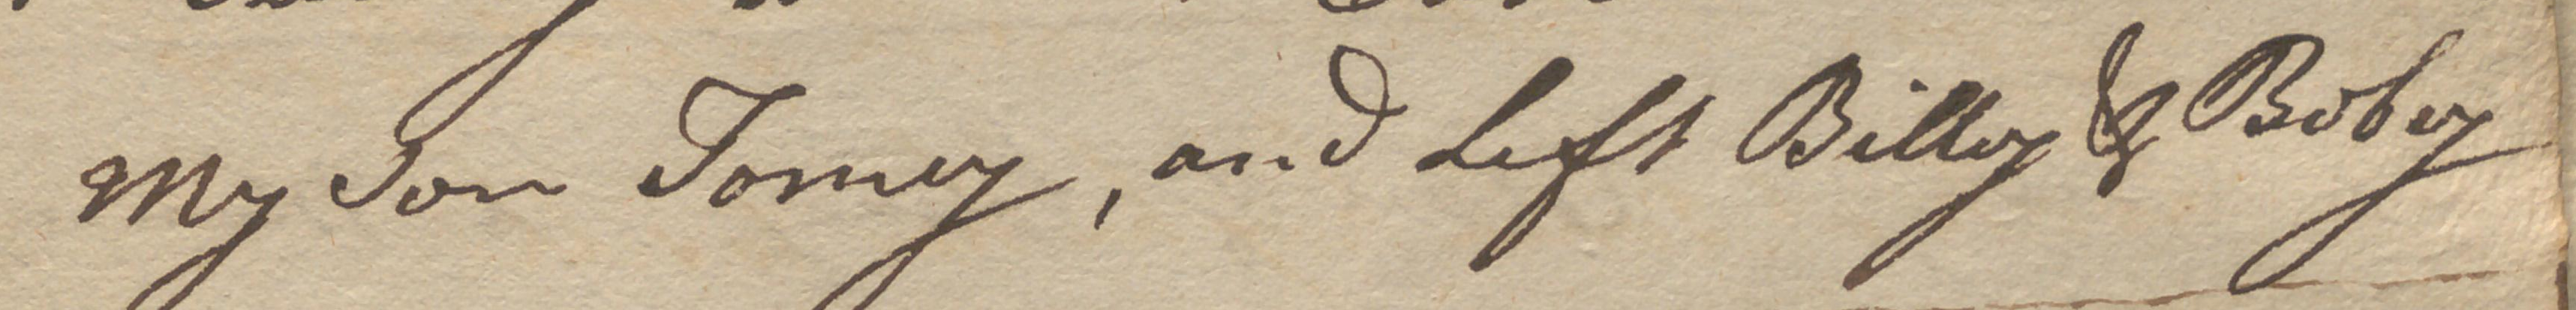My Son Tomey, and Left Billey & Bobey
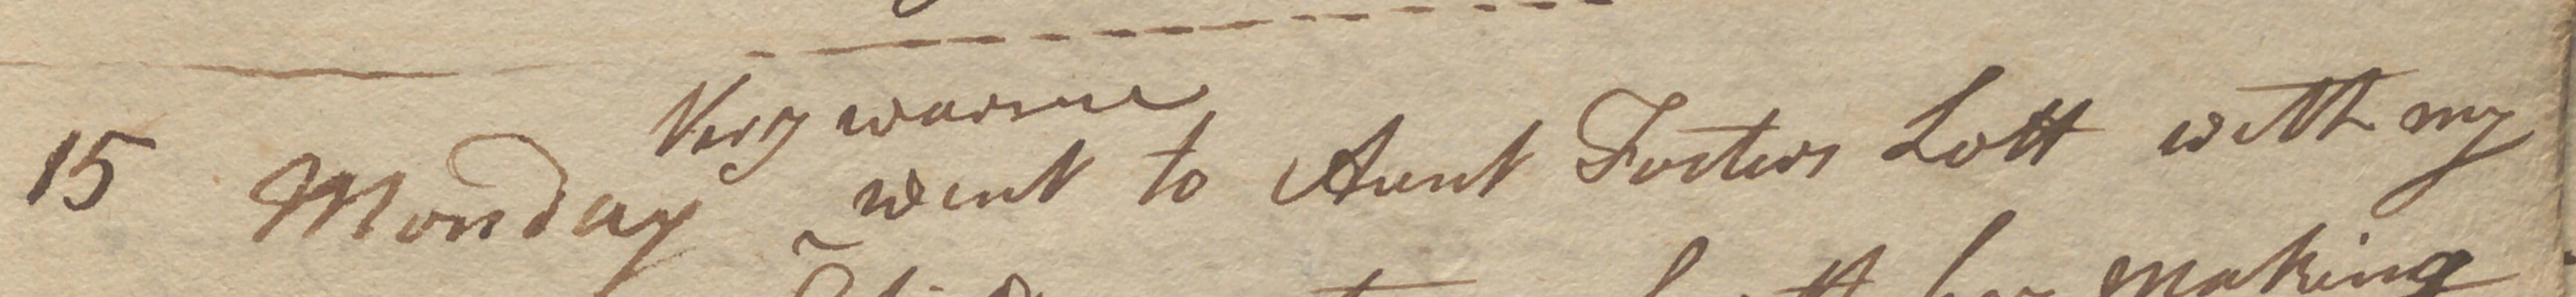15 Monday ^ went to Aunt Fosters Lott with my
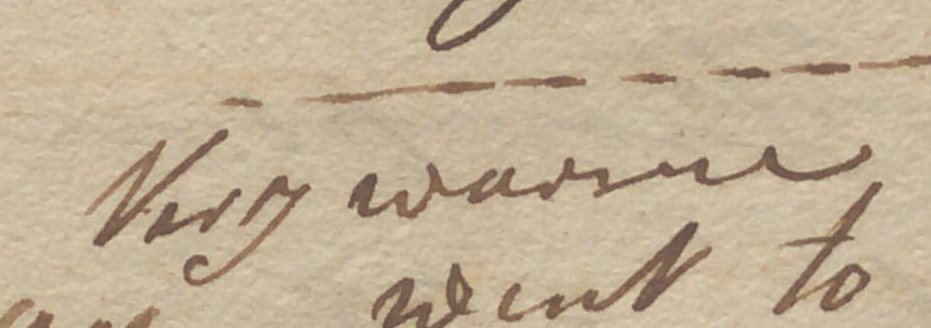Very warme
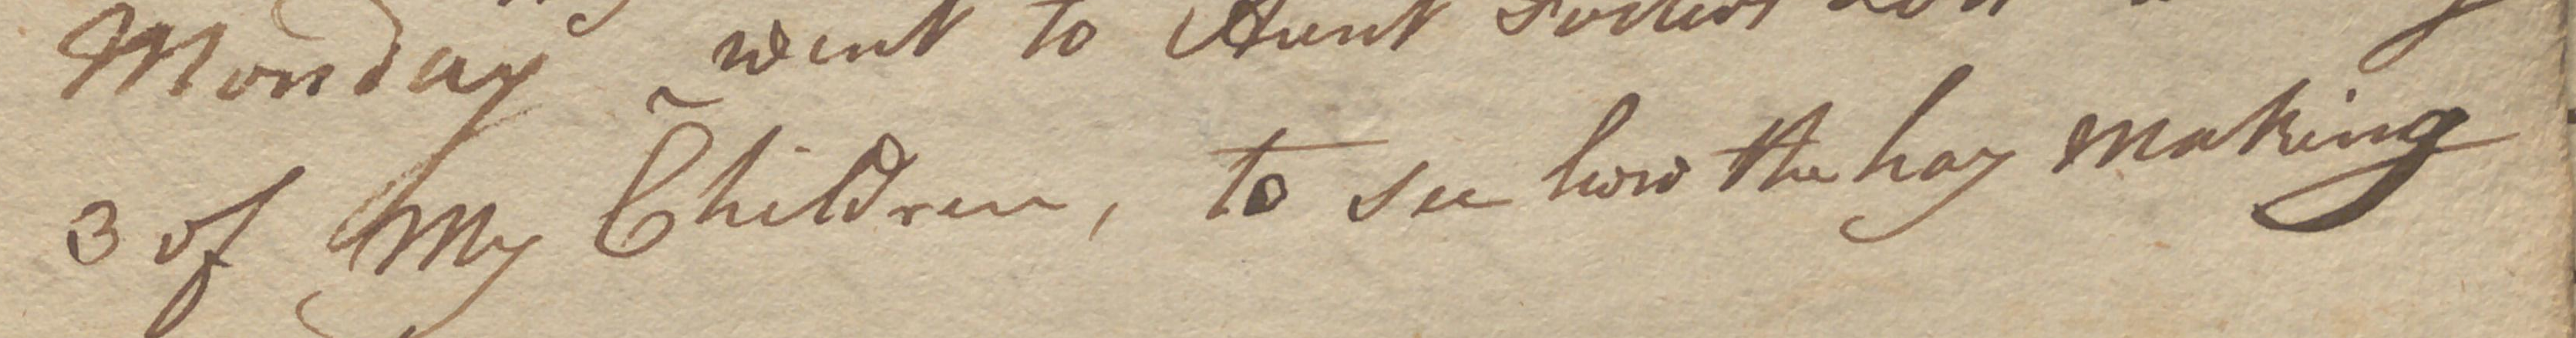3 of My Children, to see how the hay making
